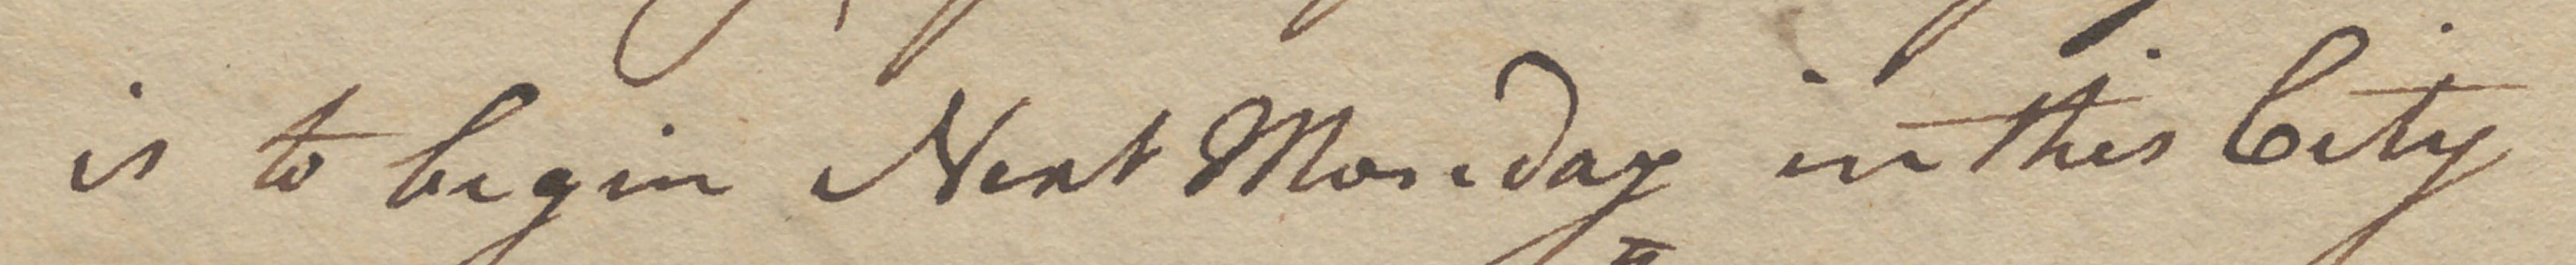is to begin Next Moneday in this City
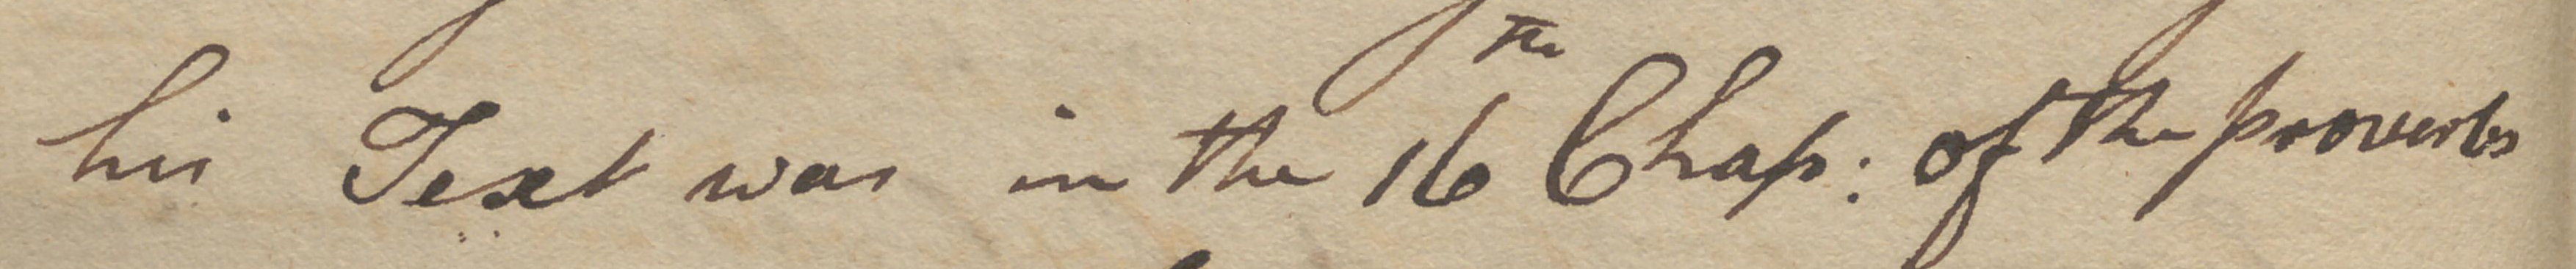his Text was in the 16^th Chap: of the proverbs
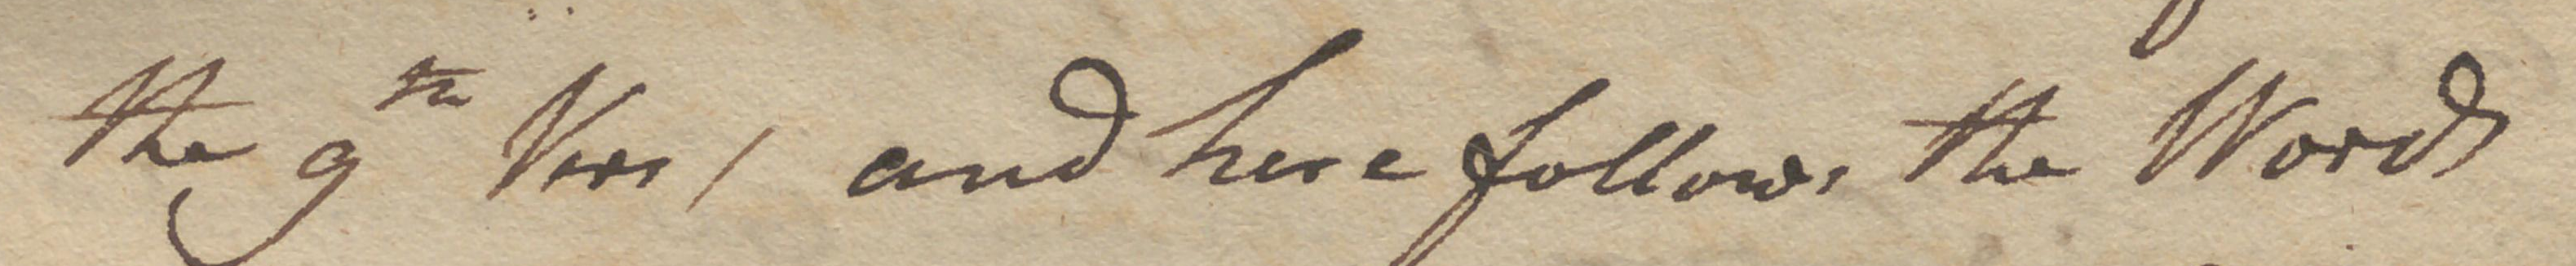the 9^th Vers, and here follows the Words
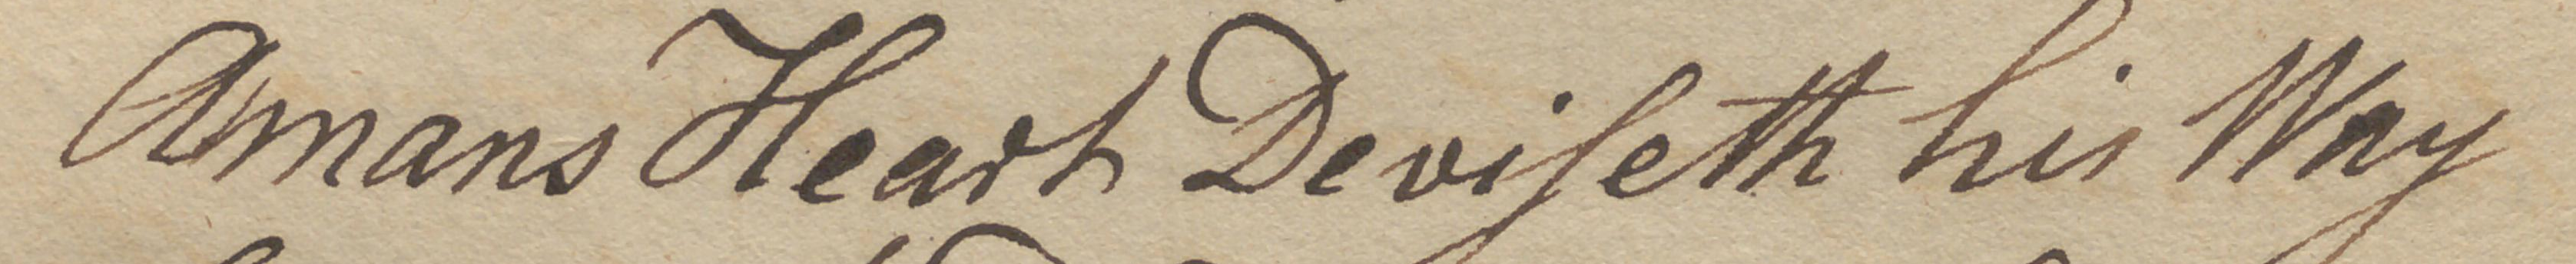A mans Heart Deviseth his Way
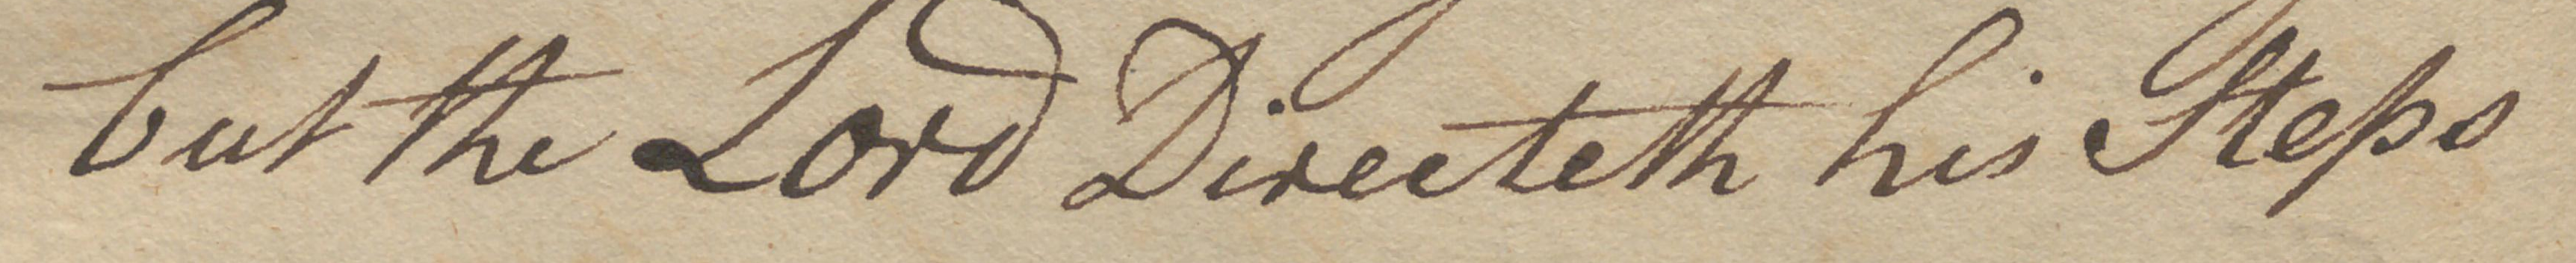but the Lord Directeth his Steps
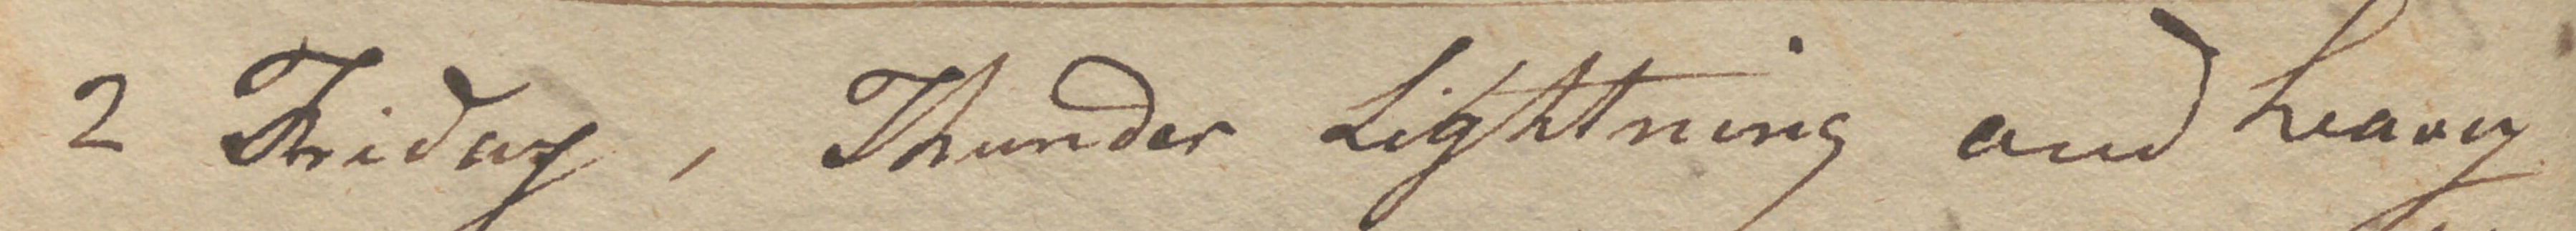2 Friday, Thunder Lightning and heavy
